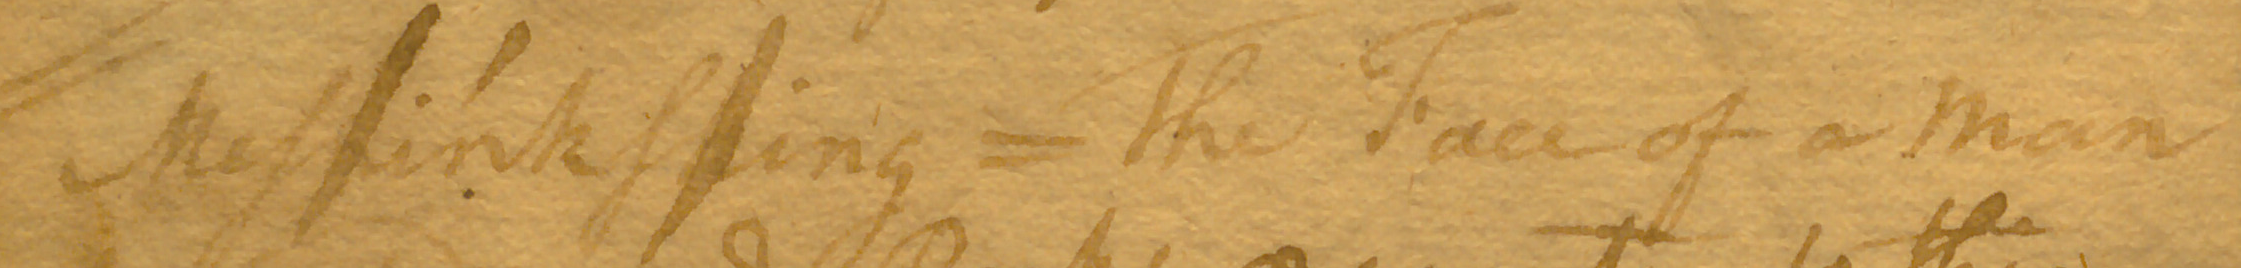shinkshing = The Face of a Man
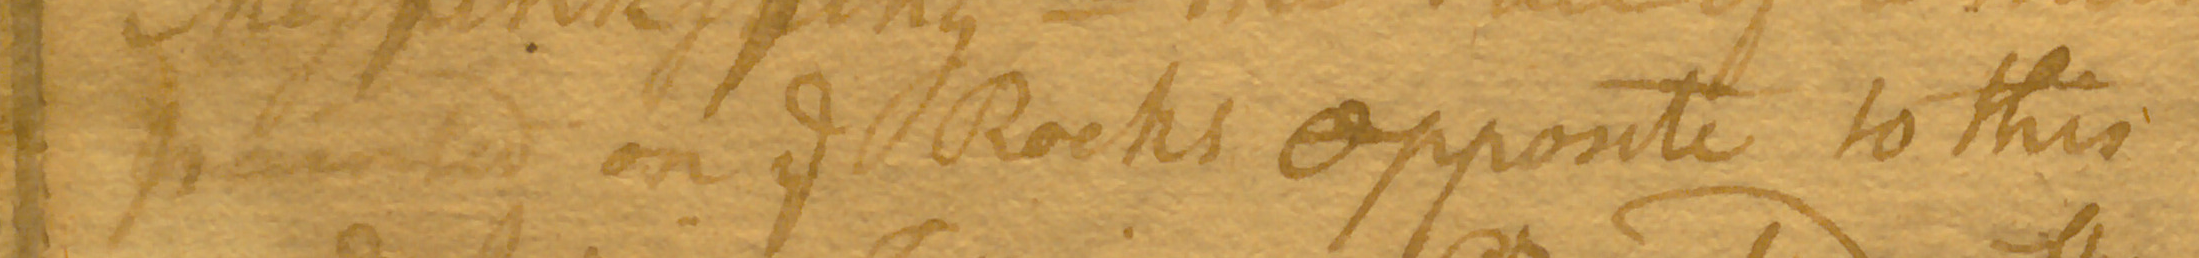[______] & Rocks Opposite to this
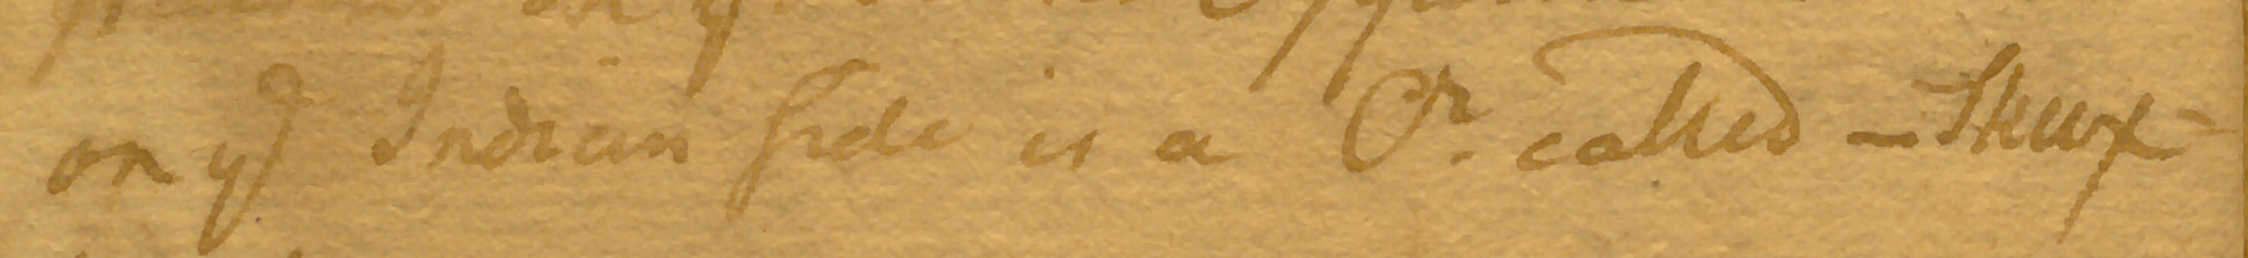on y^e Indian side is a [_] called - Skux-
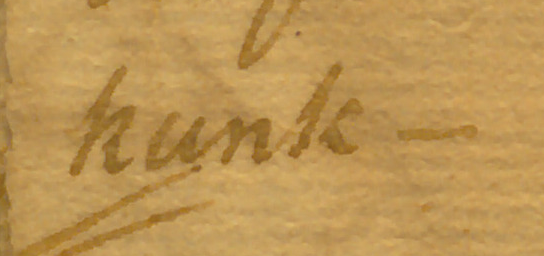kunk-
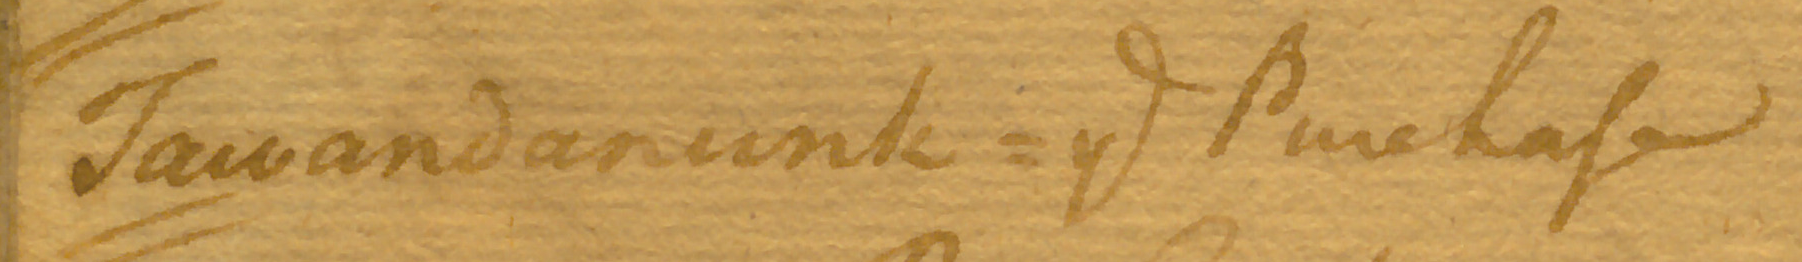Tawandanunk = & Purehasa
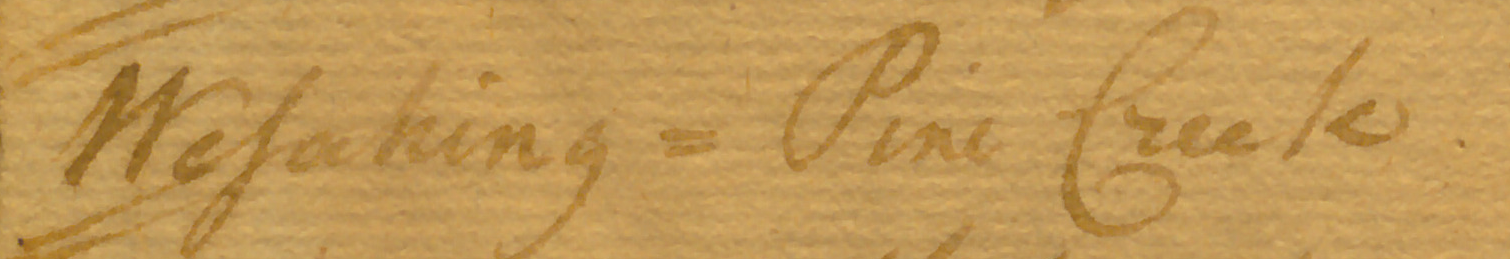Wesaking = Pine Creek
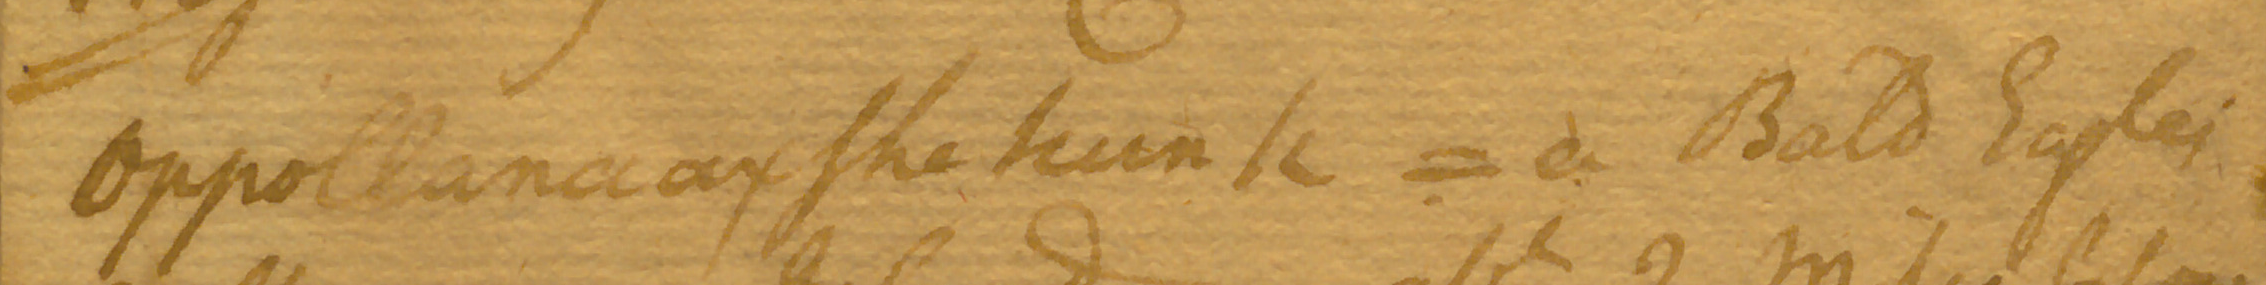Oppollanaaxshehunk = a Bald Eagle
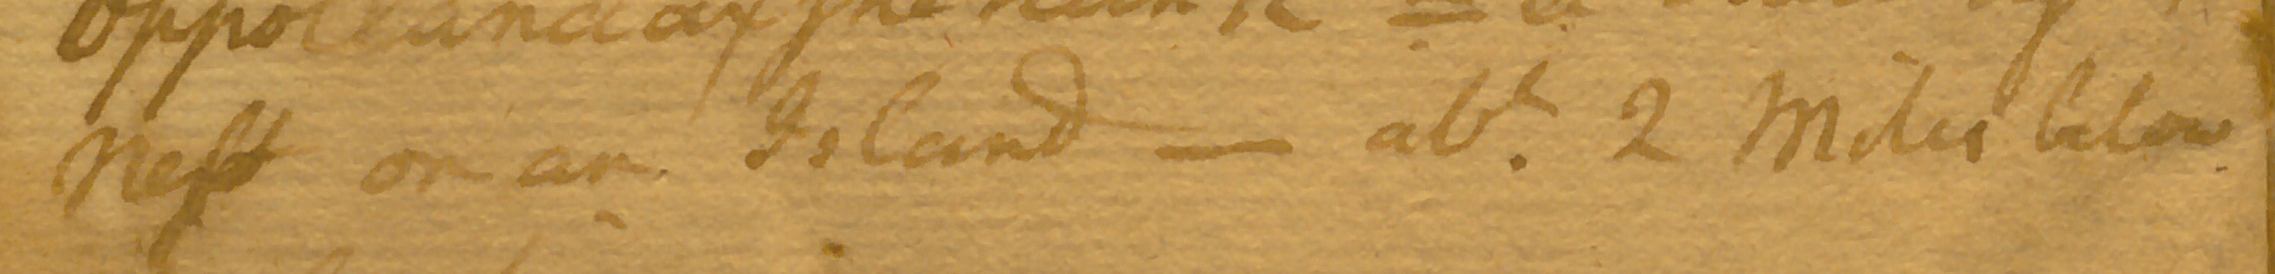nest on an Island - ab^t. 2 Miles below
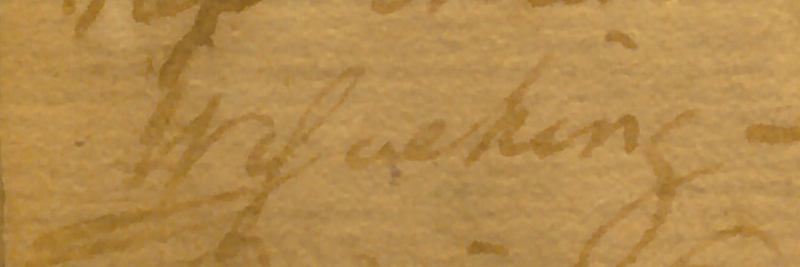Walueking
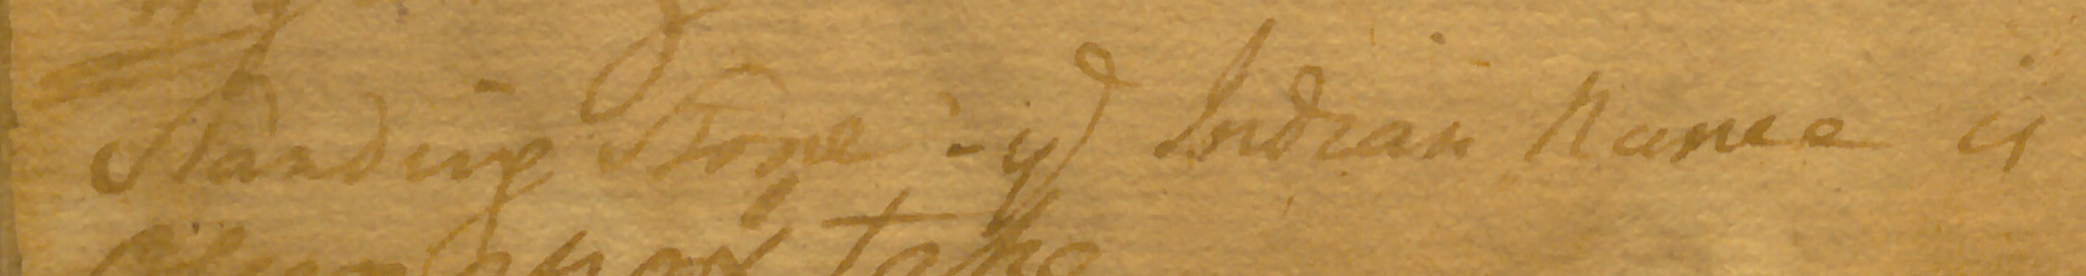Standing Bone - y^e Indian name is
